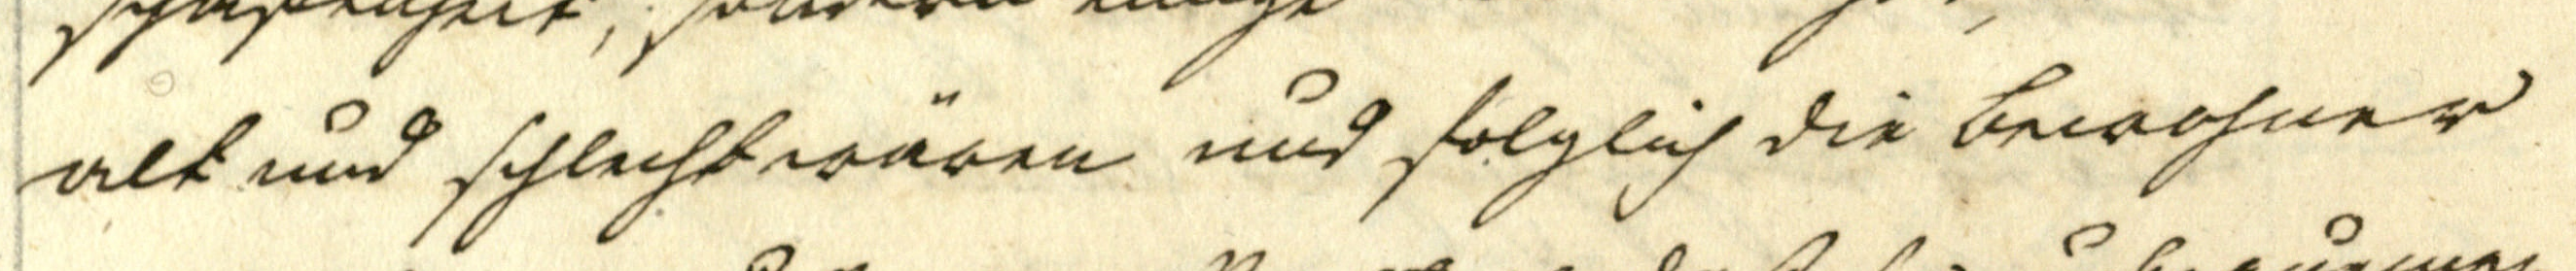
als und schlecht wären und folglich die Bewohner
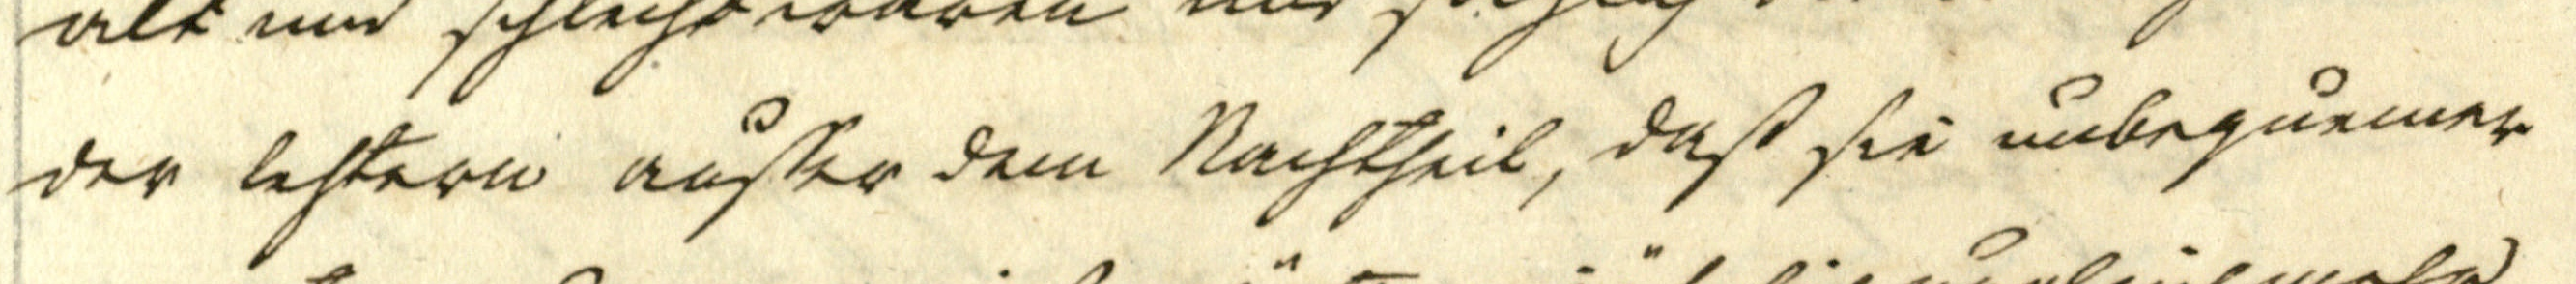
der leztern ausser dem Nachtheil, daß sie unbequemer
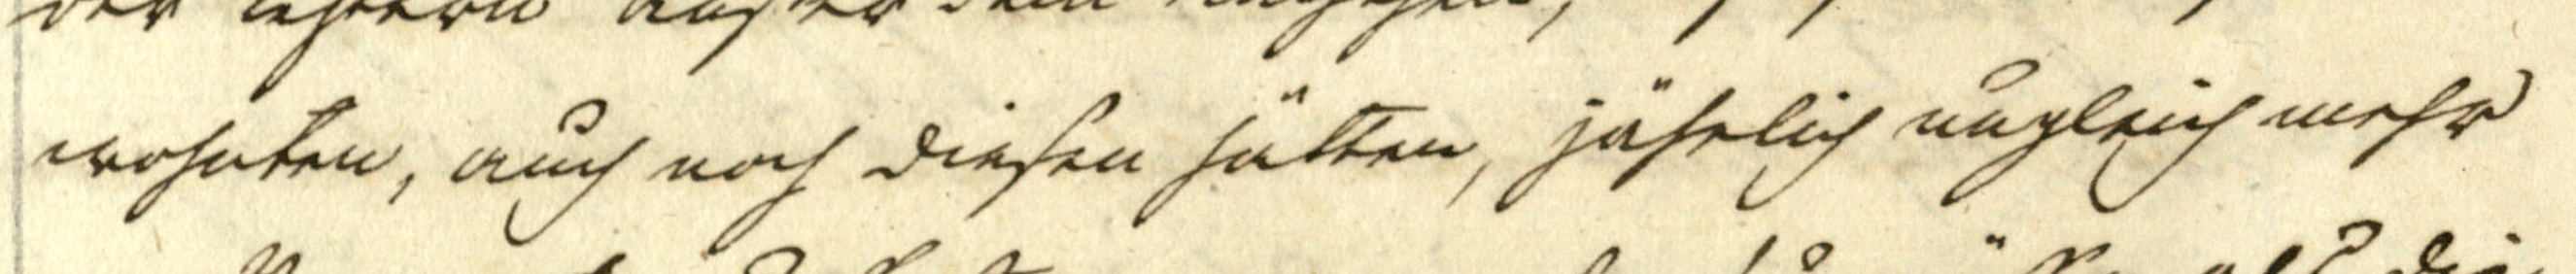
wohnten, auch noch diesen hätten, jährlich ungleich mehr
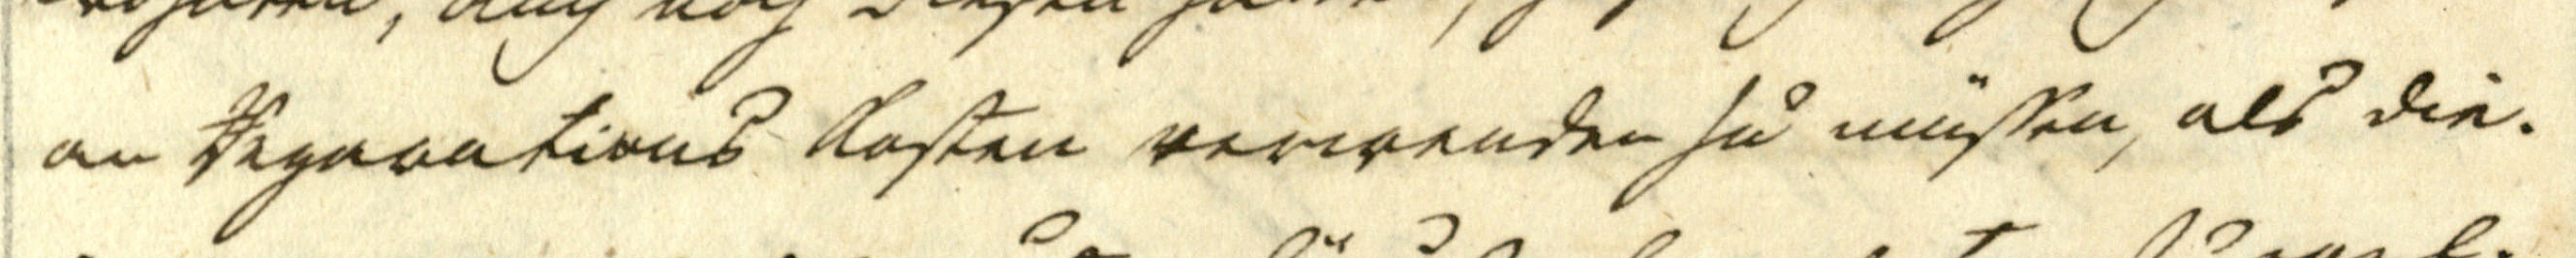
an Reparations Kosten verwenden zu müssen, als die¬
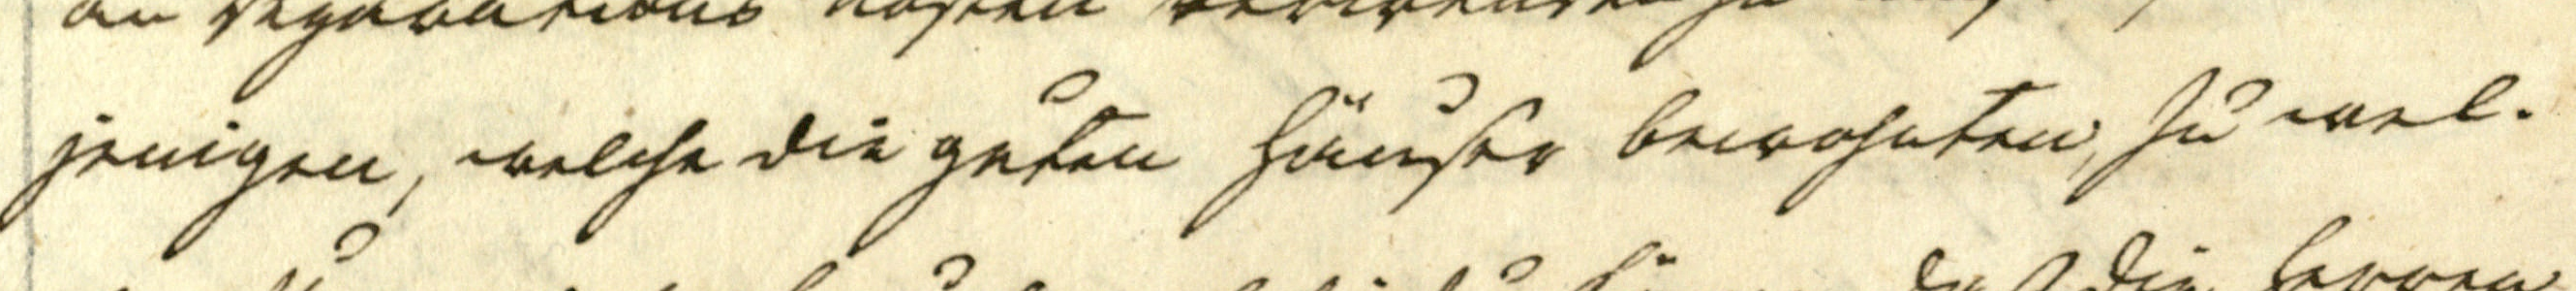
jenigen, welche die guten Häuser bewohnten, zu wel¬
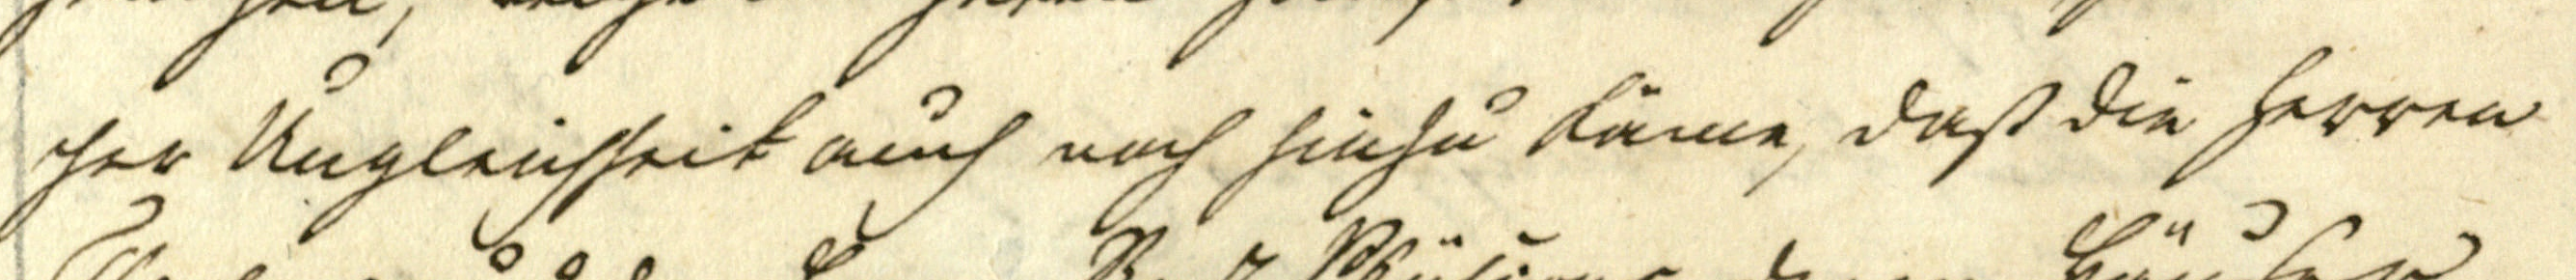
cher Ungleichheit auch noch hinzu käme, daß die Herren
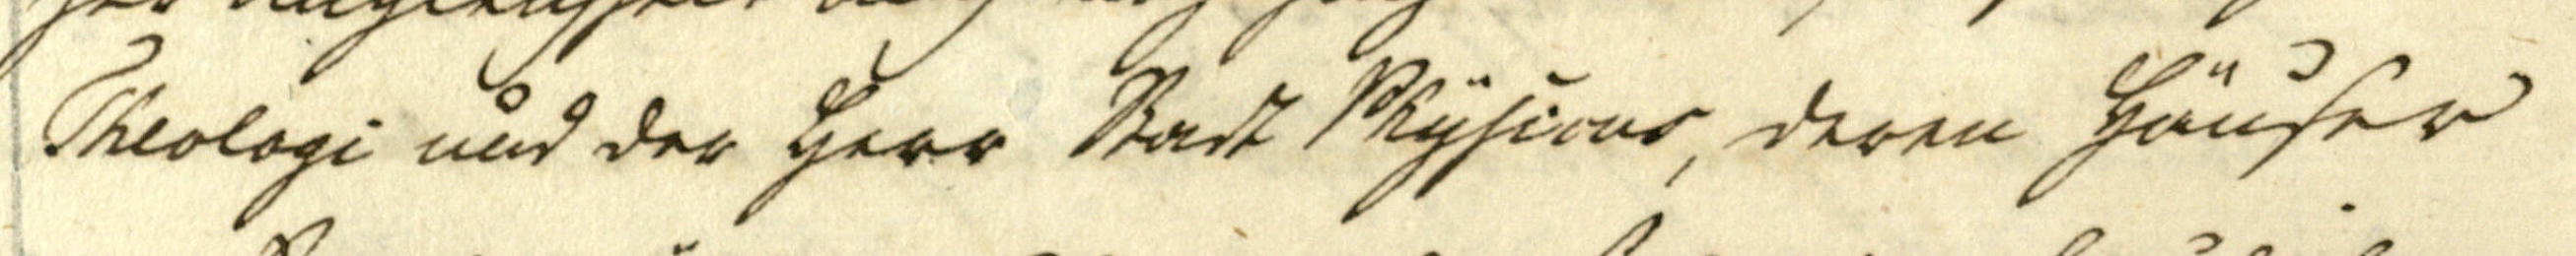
Theologi und der Herr Stadt Phÿsikus, deren Häuser
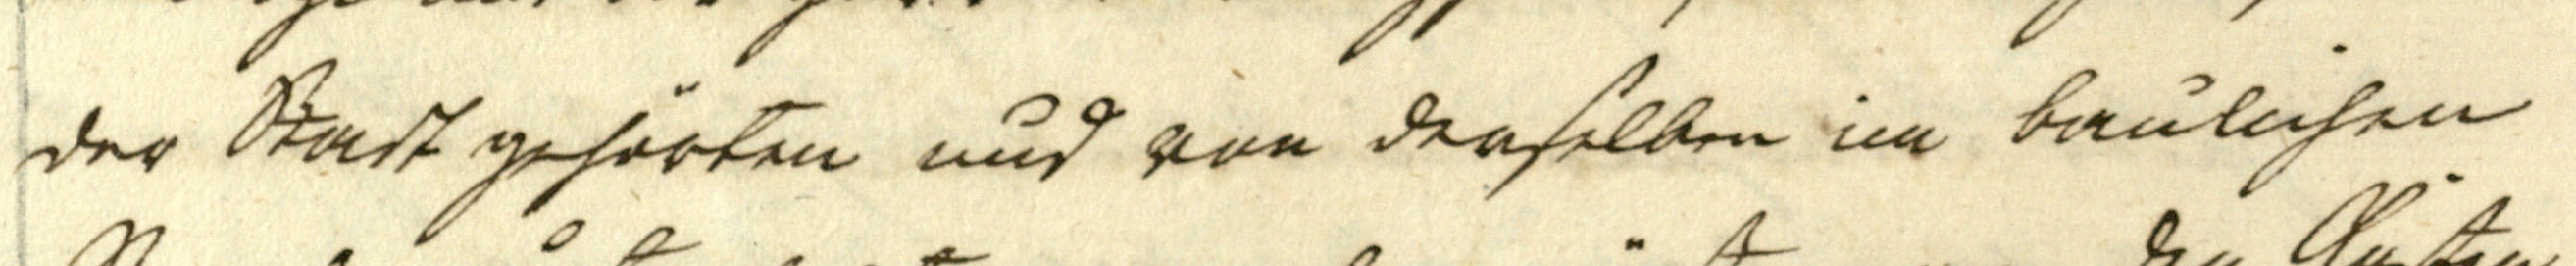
der Stadt gehörten und von derselben im baulichen
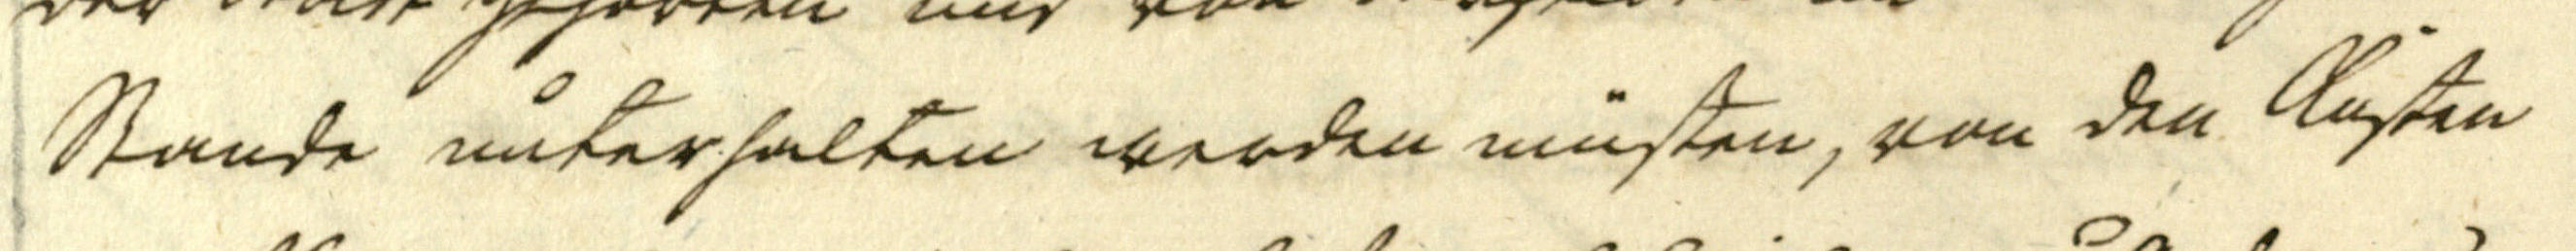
Stande unterhalten werden müßten, von den Kosten
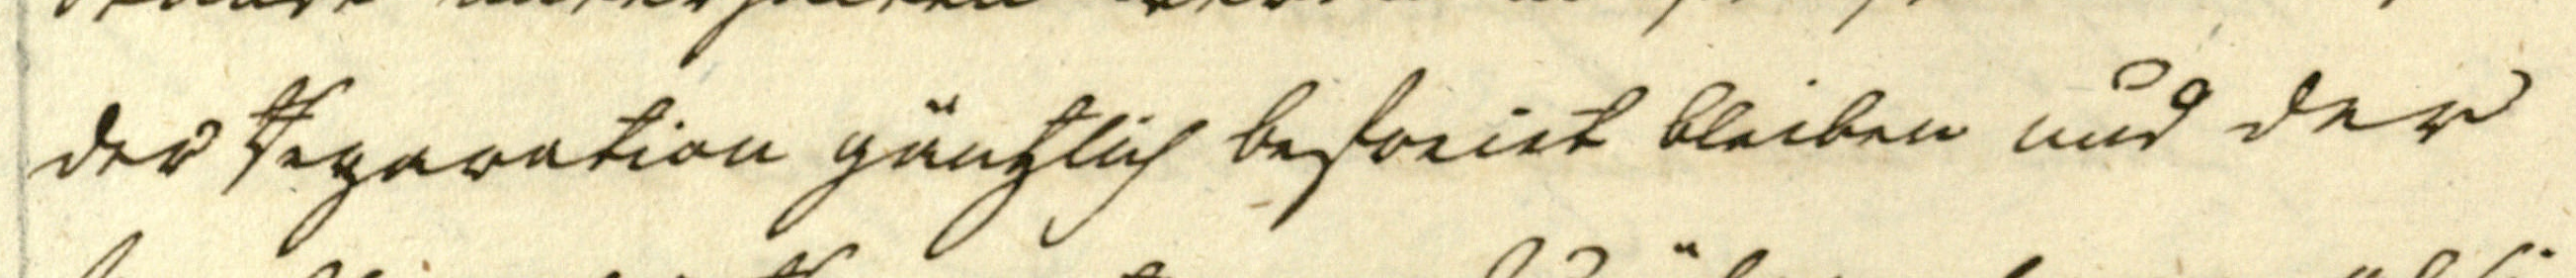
der Reparation gäntzlich befreiet bleiben und der
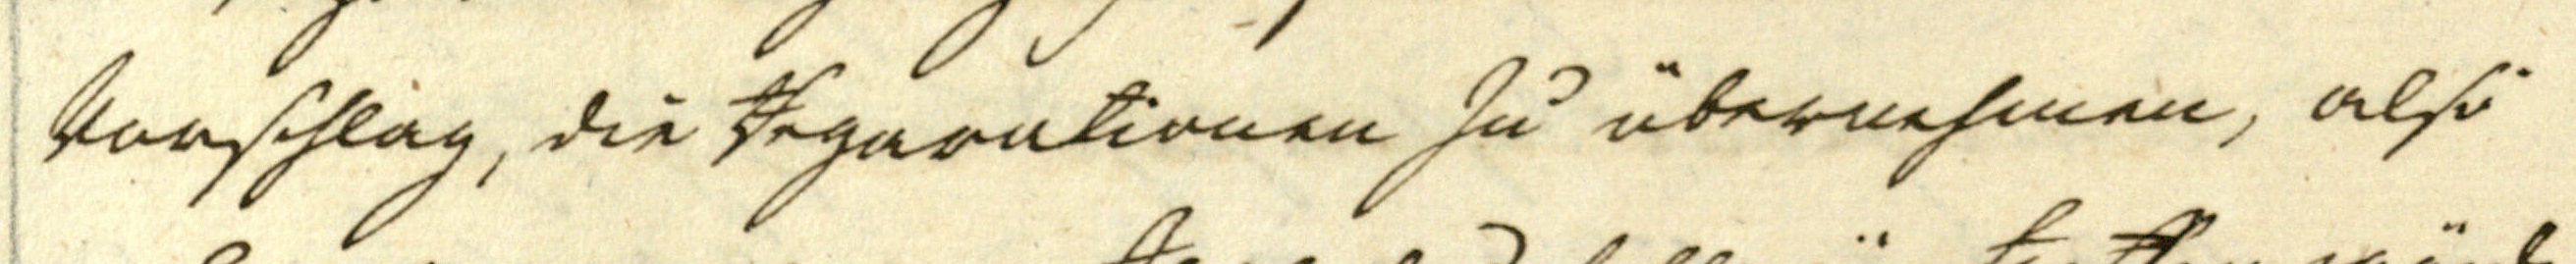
Vorschlag, die Reparationen zu übernehmen, also
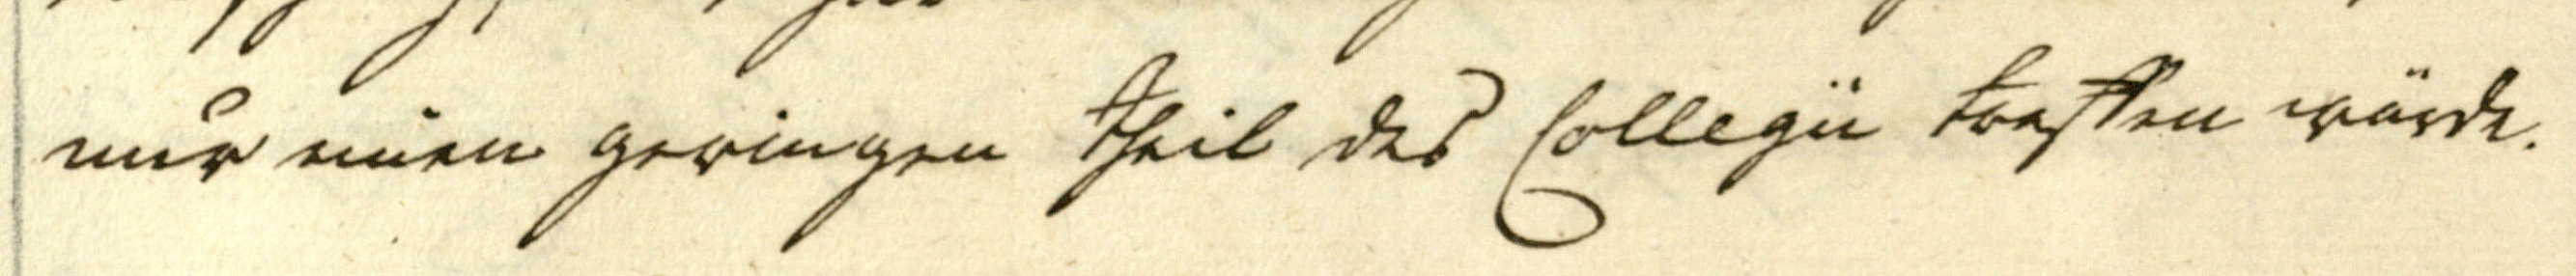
nur einen geringen Theil des Collegii treffen würde.
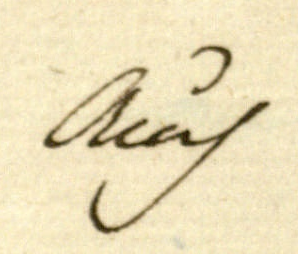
Auch
